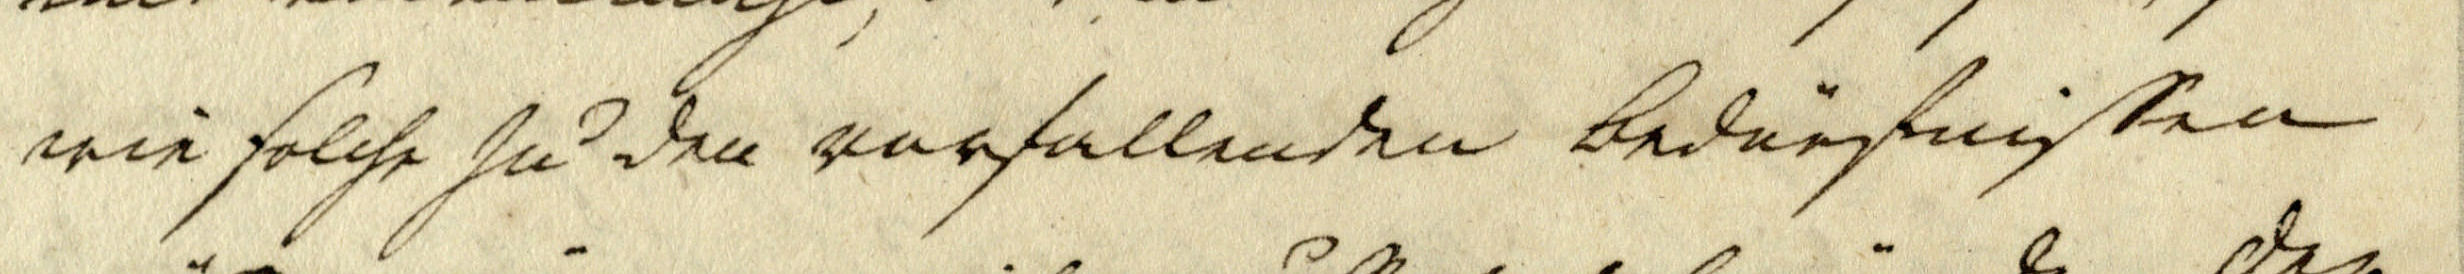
wie solche zu den vorfallenden Bedürfnissen
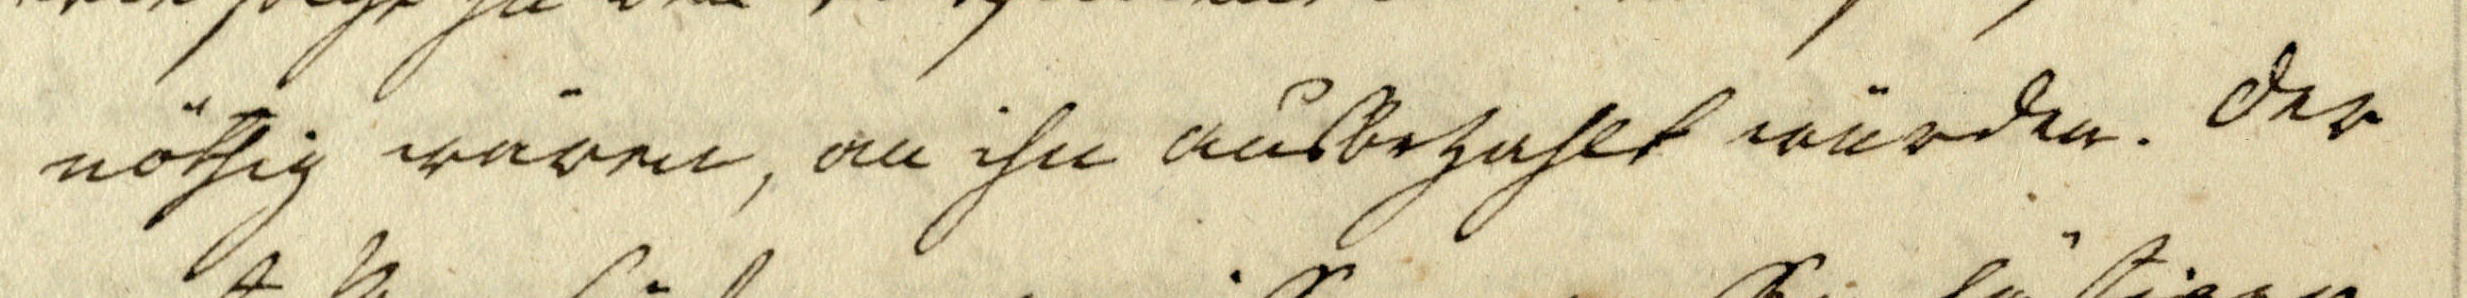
nöthig wären, an ihn ausbezahlt würden. Der
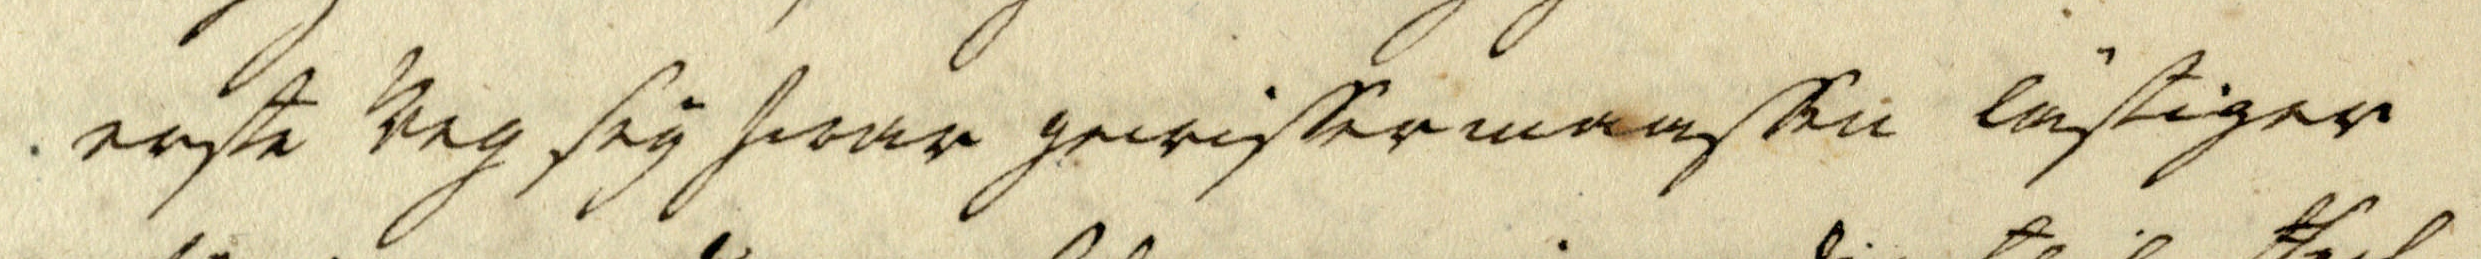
erste Weg seÿ zwar gewissermaassen lästiger
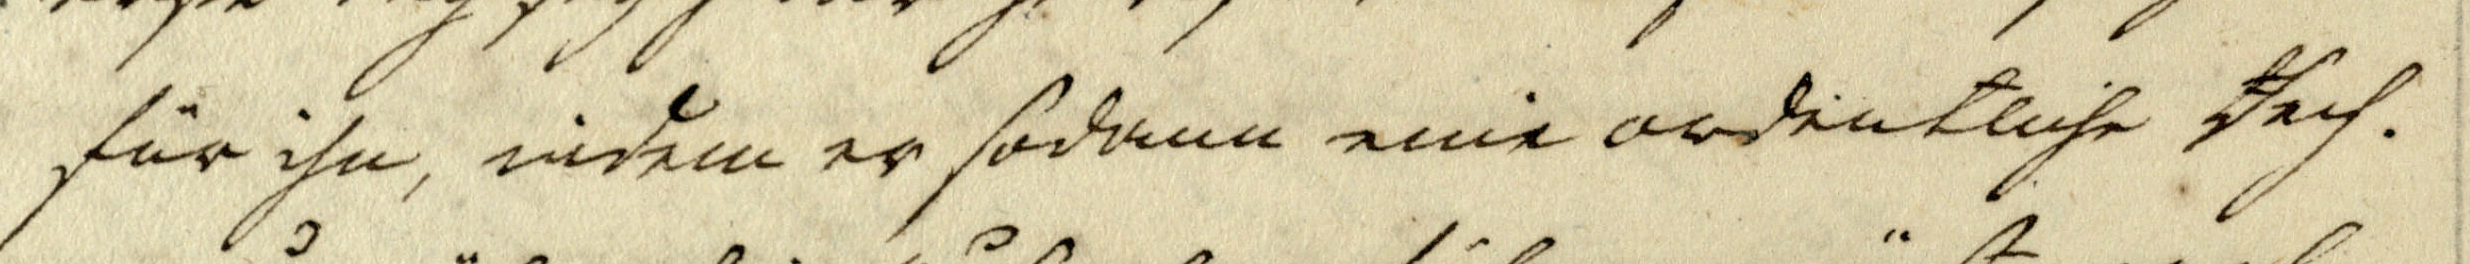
für ihn, indem er sodann eine ordentliche Rech¬
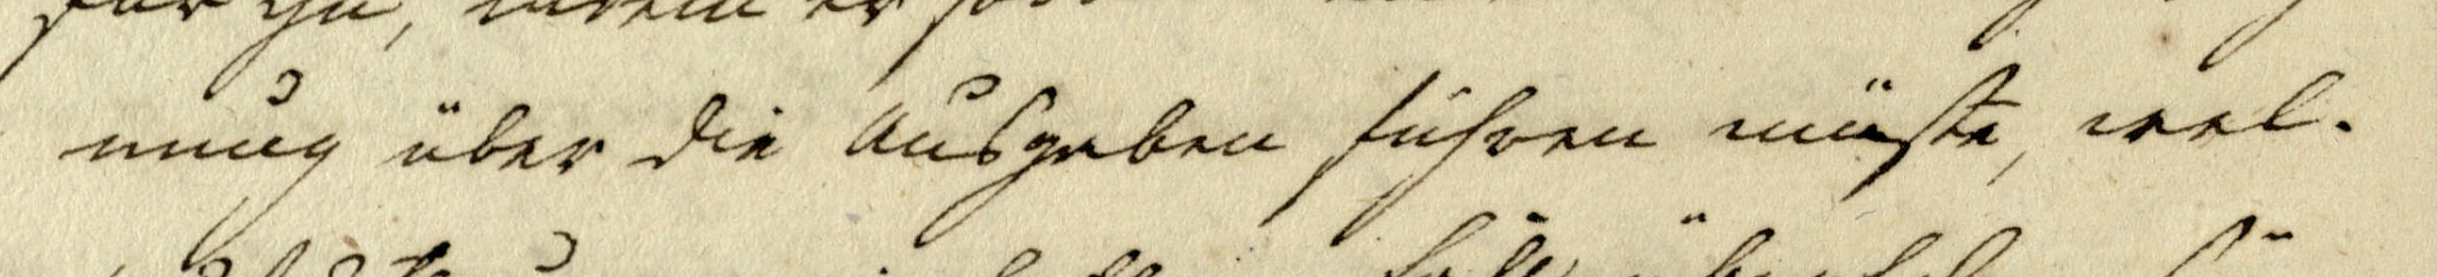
nung über die Ausgaben führen müßte, wel¬
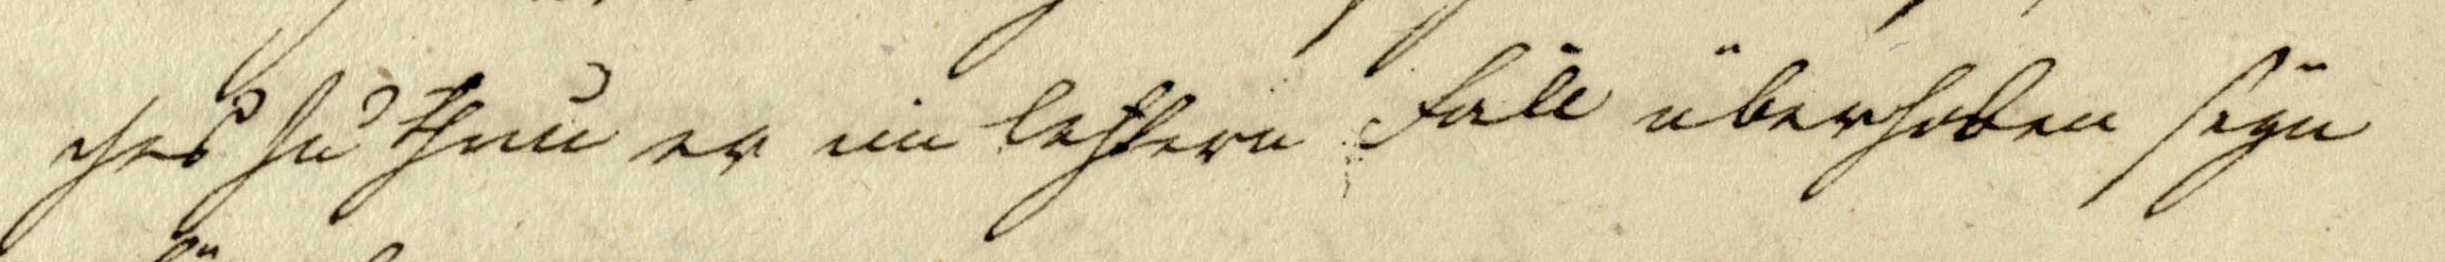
ches zu thun er im letztern Fall überhoben seÿn
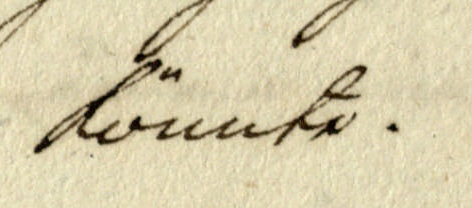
könnte.
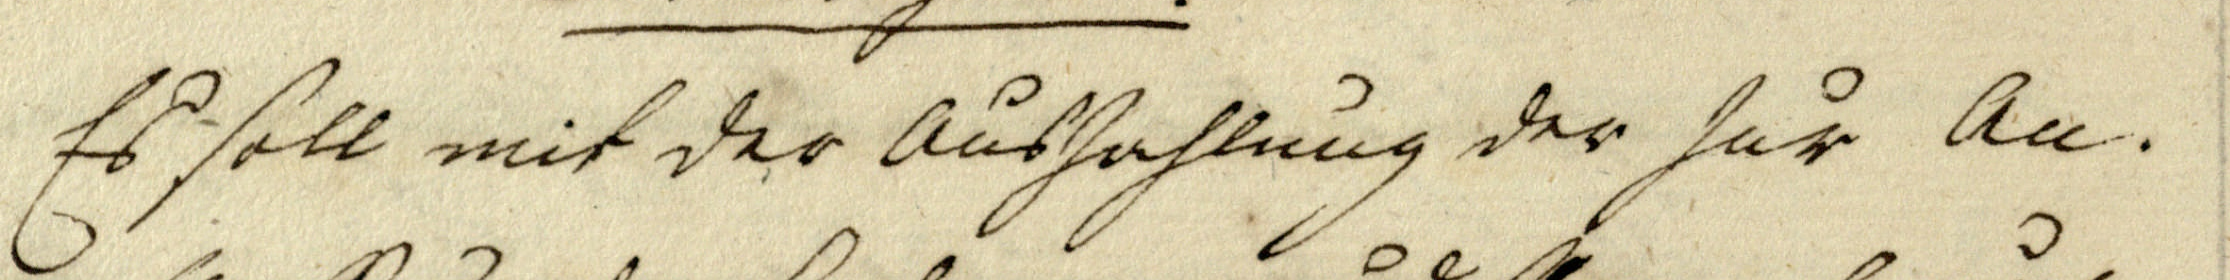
Es soll mit der Auszahlung der zur An¬
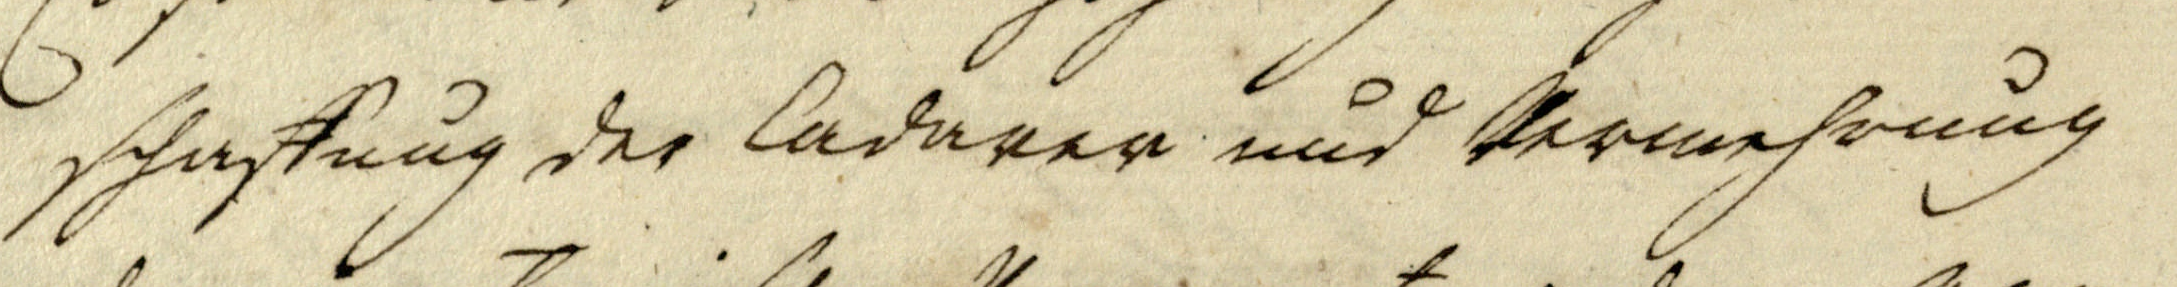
schaffung der Cadaver und Vermehrung
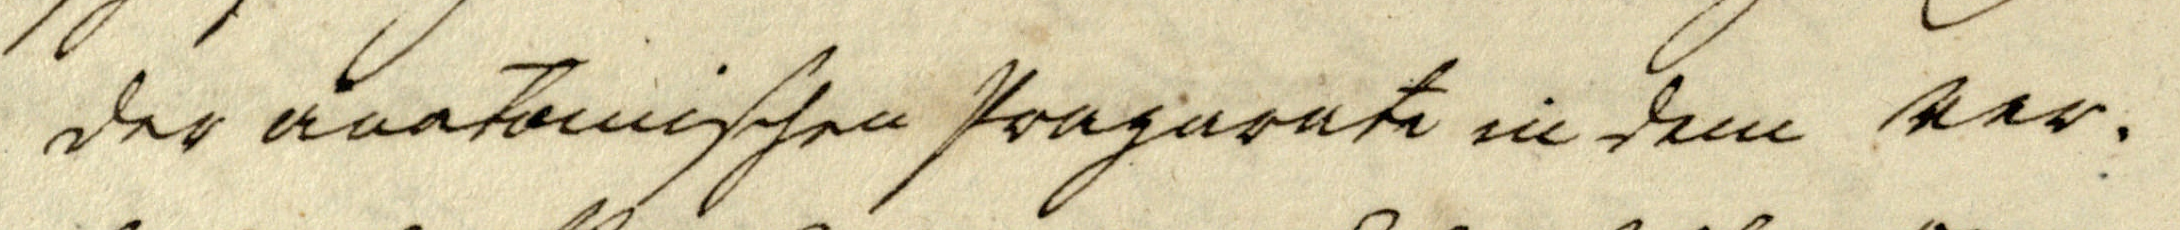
der anatomischen Praparate in dem ver¬
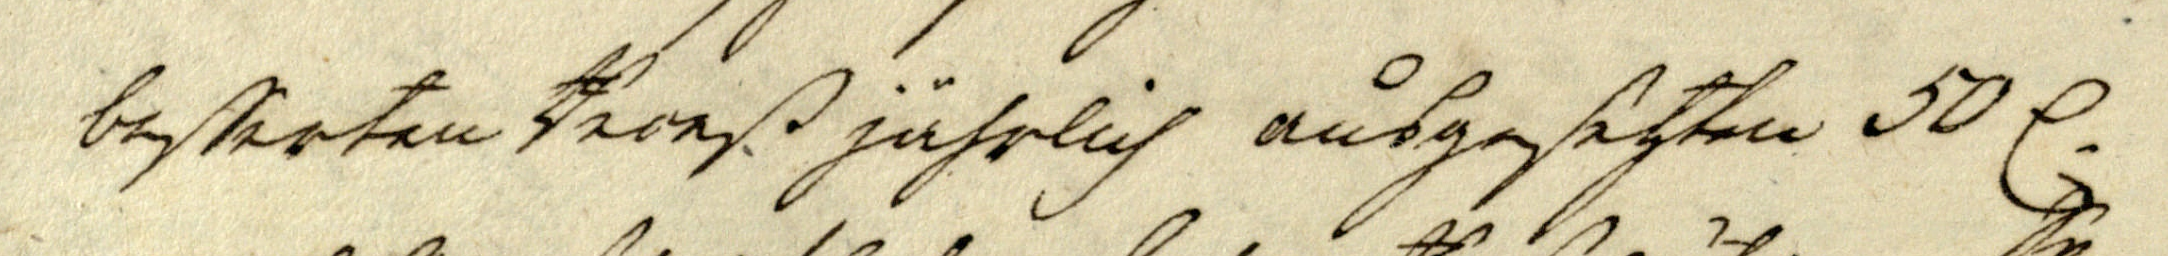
besserten Receß jährlich ausgesetzten 50 l.
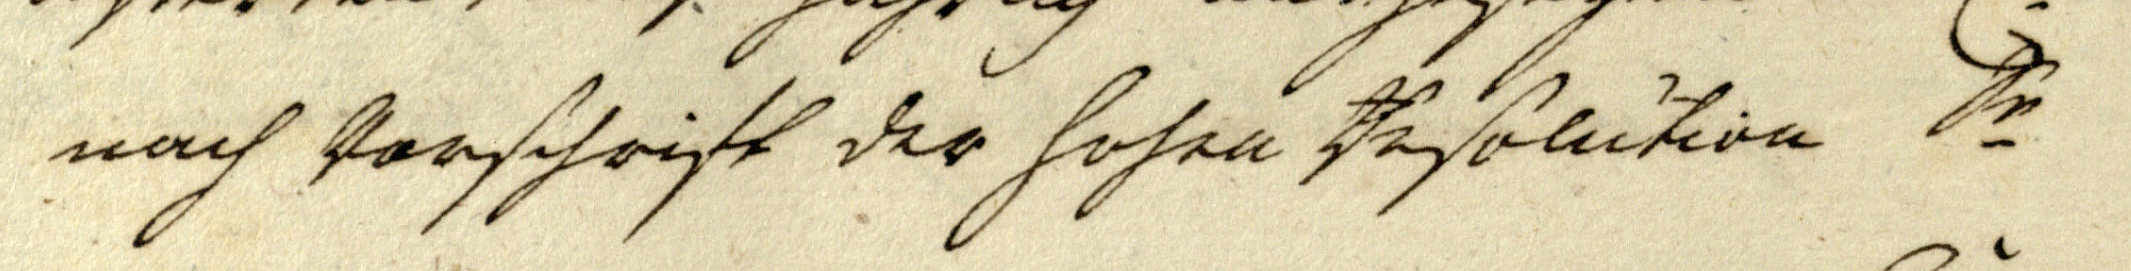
nach Vorschrift der hohen Resolution Sr
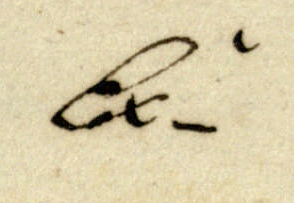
Ex¬
